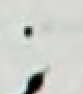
„
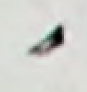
„
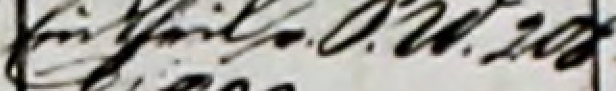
Ein Theil v. P. W. 208
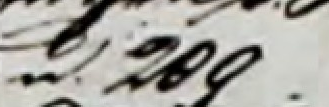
u. 209
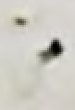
„
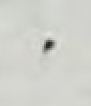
„
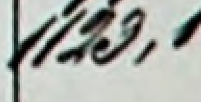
1123,1
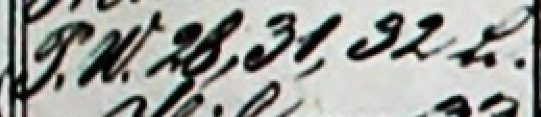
P.W. 28,31,32 u.
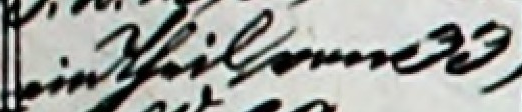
ein Theil von 33
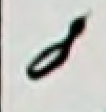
8
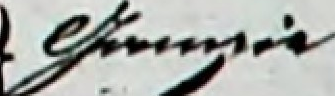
Gamzie
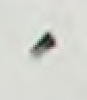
„
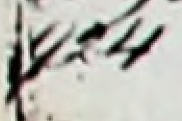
924
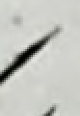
1
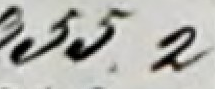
355.2
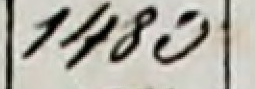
1483
